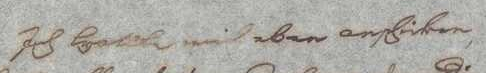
Ich wollte mich eben anschicken,
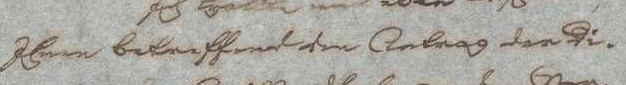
Ihnen betreffend den Antrag der Di-
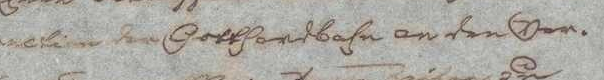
rection der Gotthardbahn an den Ver-
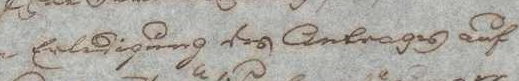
Erledigung des Antrages auf
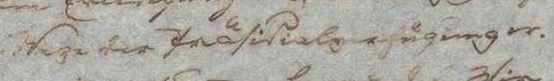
Wege der Präsidialverfügung er-
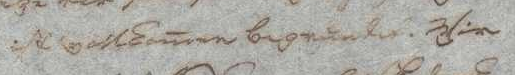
ist vollkommen begründet. Wir
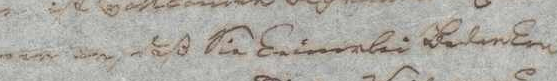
nehmen an, daß Sie keinerlei Bedenken
